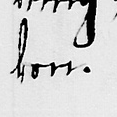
den.
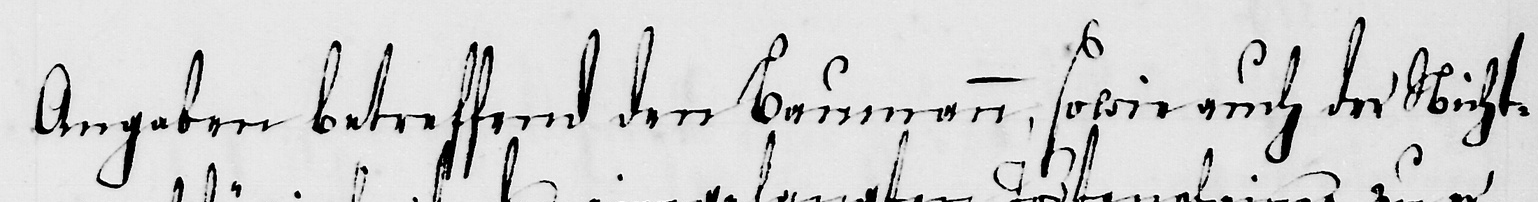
Angaben betreffend den Baumann, sowie auch der Nicht¬
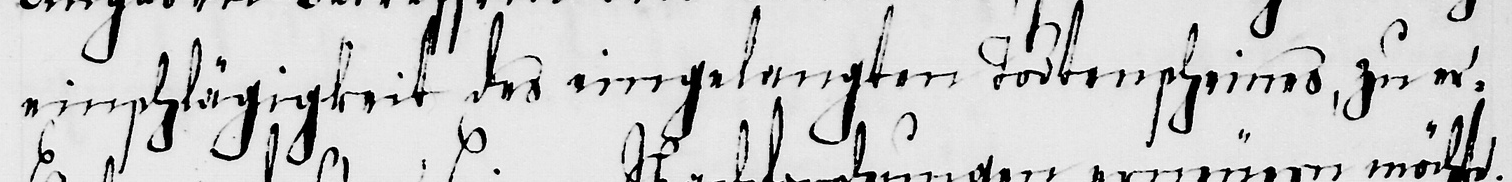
einschlägigkeit des eingelangten Todtenscheines, zu er¬
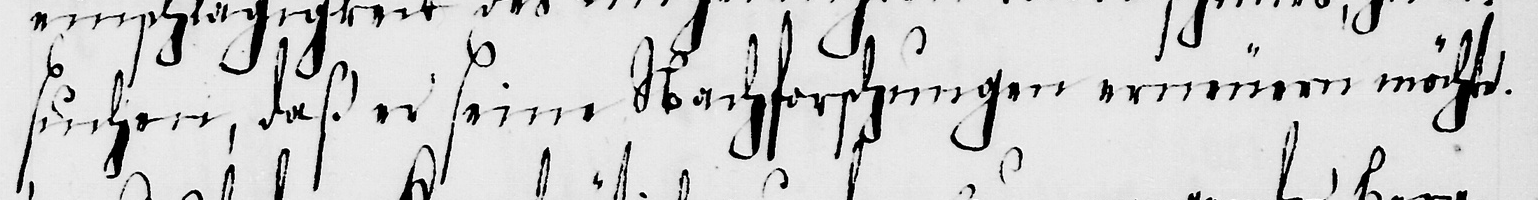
suchen, daß er seine Nachforschungen erneuern möchte.
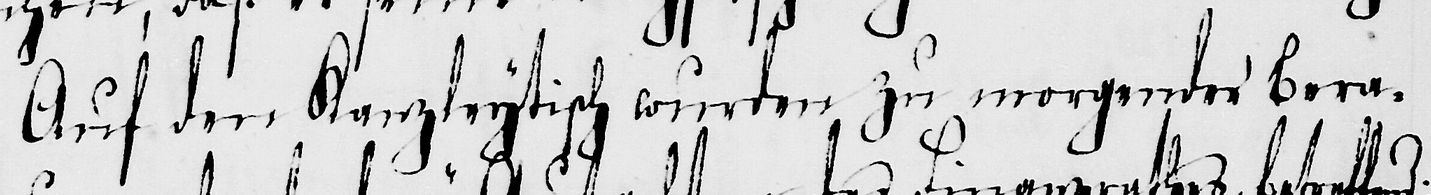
Auf den Kanzleytisch wurden zu morgender Bera¬
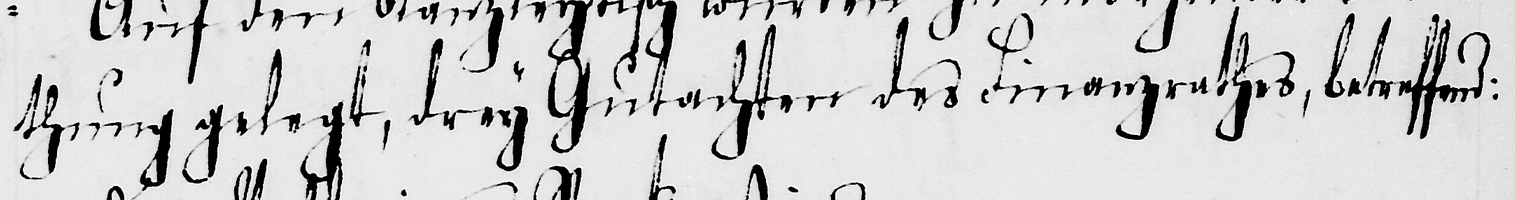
thung gelegt, drey Gutachten des Finanzrathes, betref¬
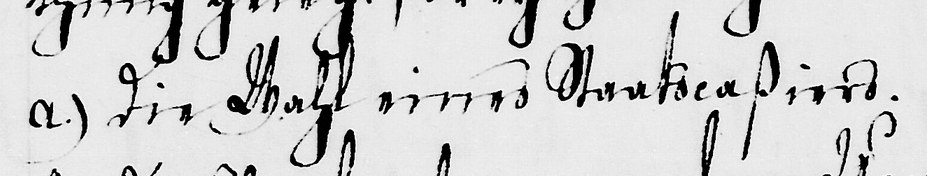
a.) Die Wahl eines Staatscaßiers.
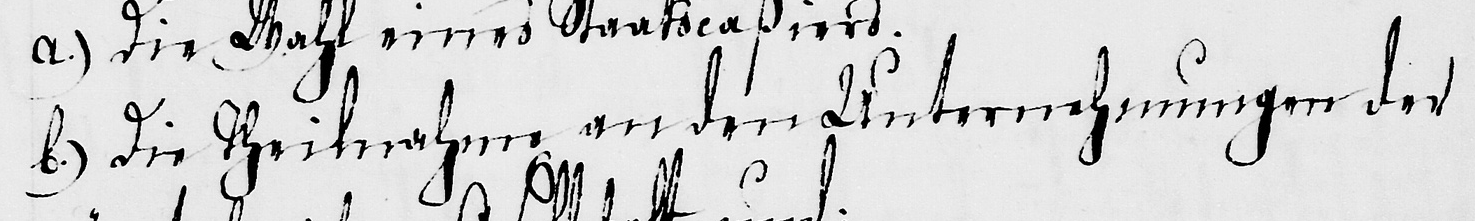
b.) Die Theilnahme an den Unternehmungen der
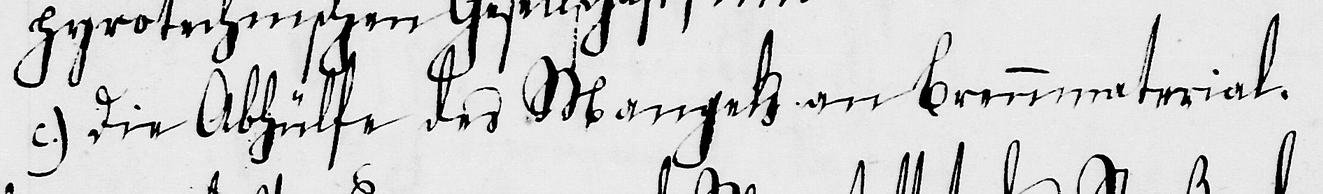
c.) Die Abhülfe des Mangels an Brennmaterial.
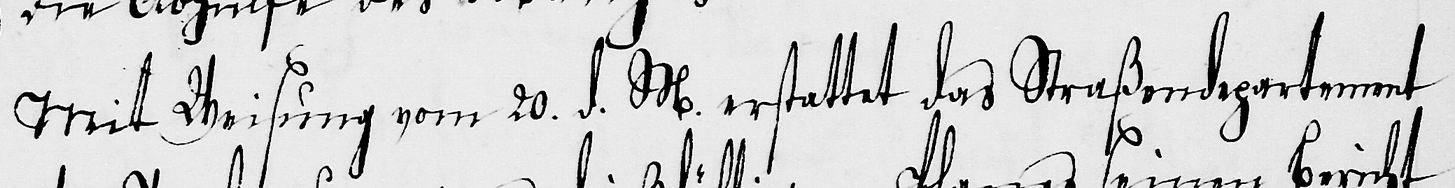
Mit Weisung vom 20. d. M. erstattet das Straßendepartement
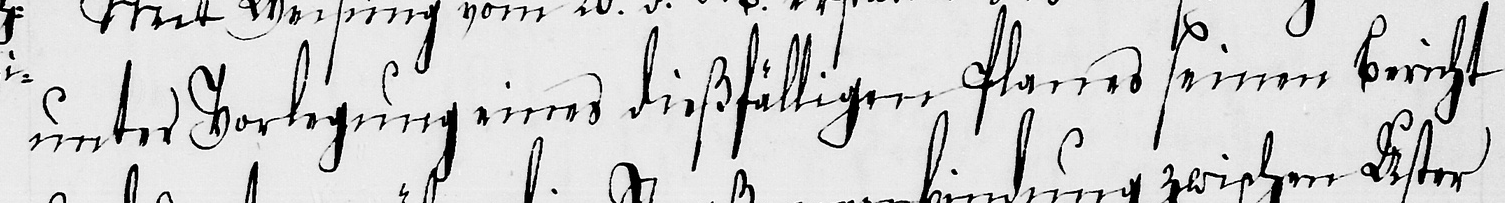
unter Vorlegung eines dießfälligen Planes seinen Bericht
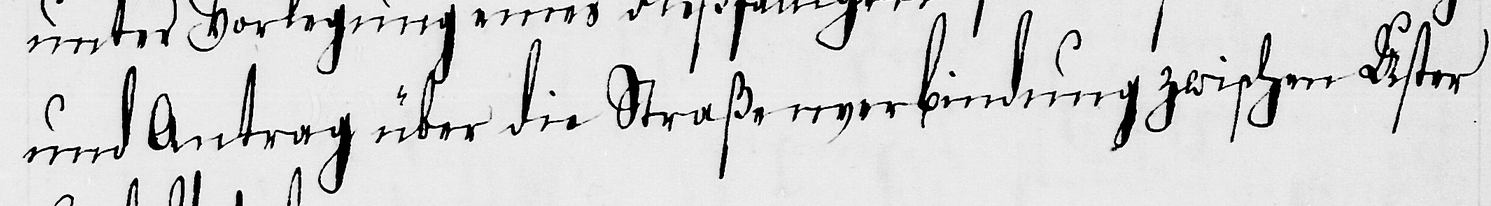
und Antrag über die Straßenverbindung zwischen Uster
